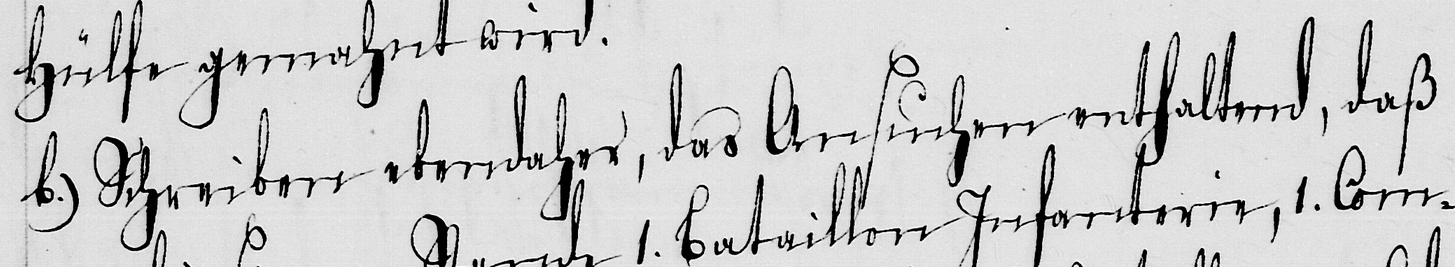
b.) Schreiben ebendaher, das Ansuchen enthaltend, daß
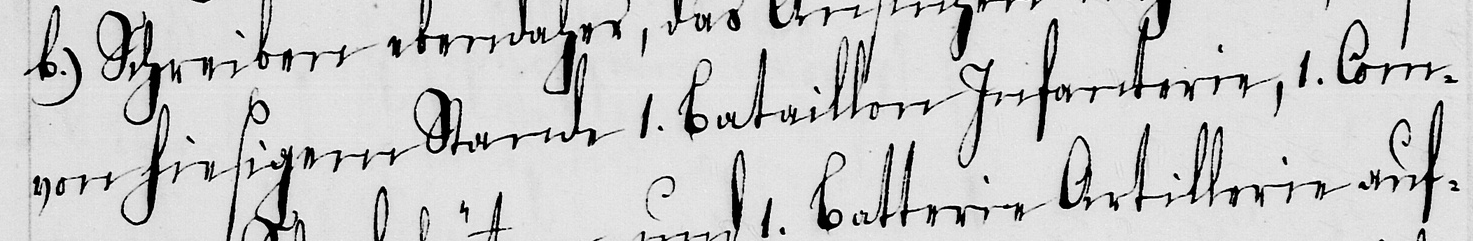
von hiesigem Stande 1. Bataillon Infanterie, 1. Com¬
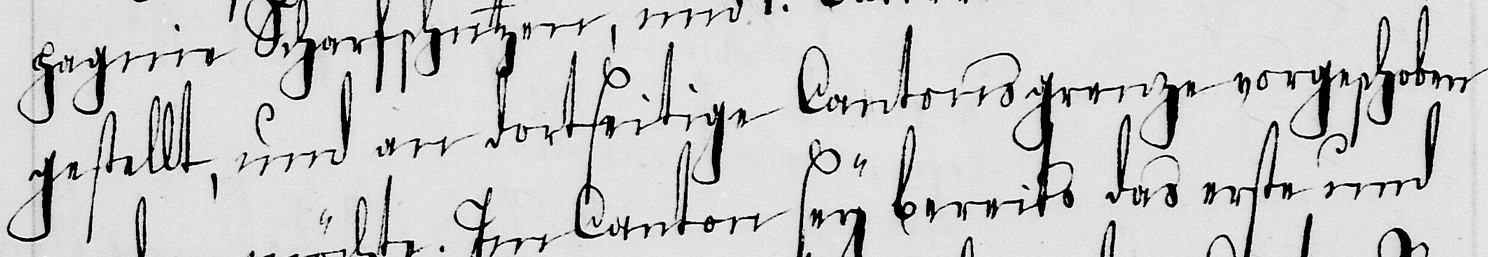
gestellt, und an dortseitige Cantonsgrenze vorgeschoben
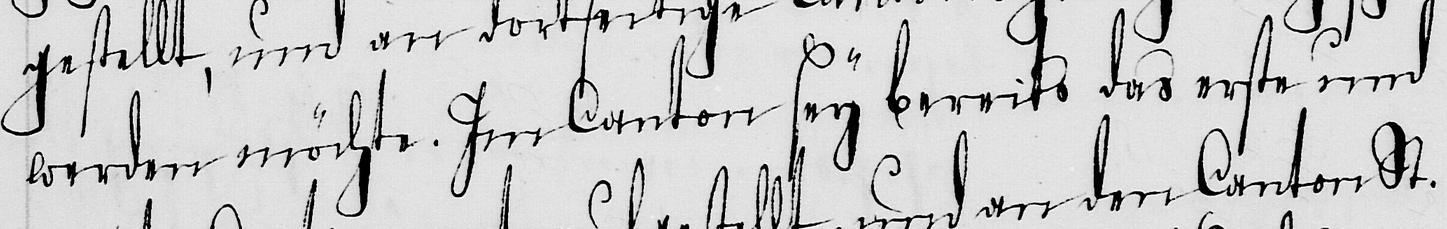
werden möchte. Im Canton sey bereits das erste und
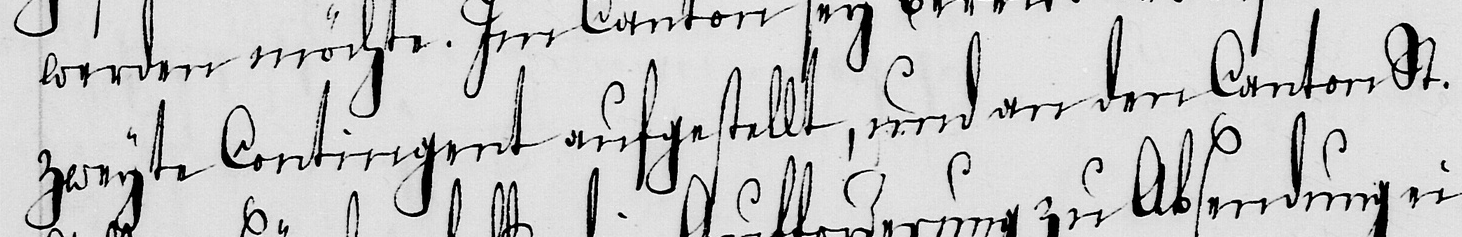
zweyte Contingent aufgestellt, und an den Canton St.
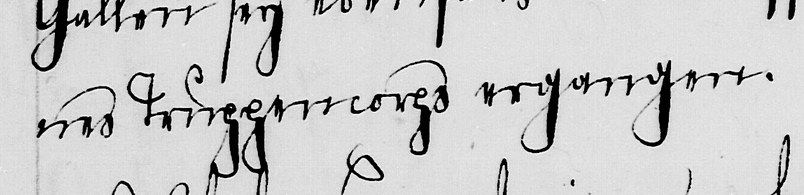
nes Truppencorps ergangen.
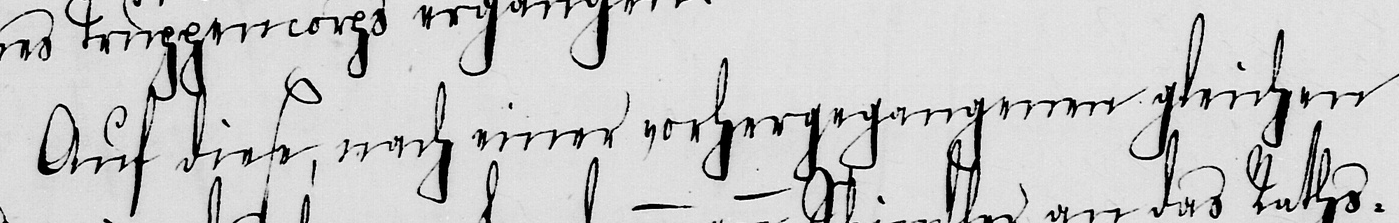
Auf diese, nach einer vorhergegangenen gleichen
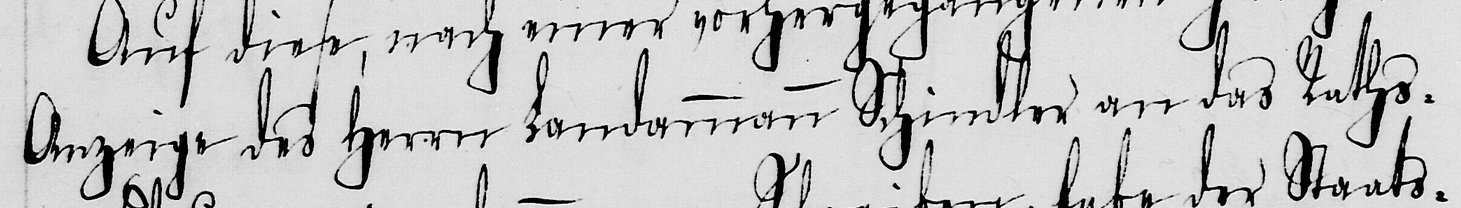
Anzeige des Herrn Landammann Schindler an das Raths¬
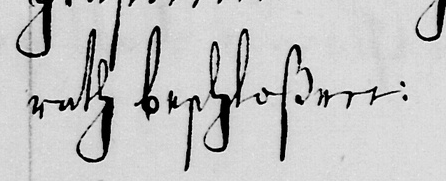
ath beschloßen:
